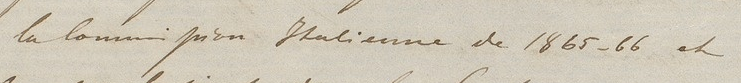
la Commission Italienne de 1865–66 et
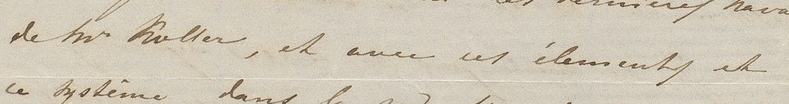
de MrKoller, et avec ces élements et
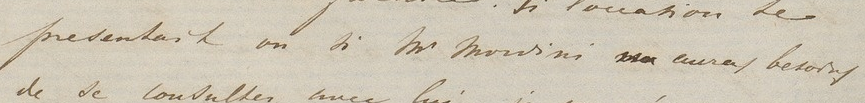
presentait ou si MrMordinisera auras besoins
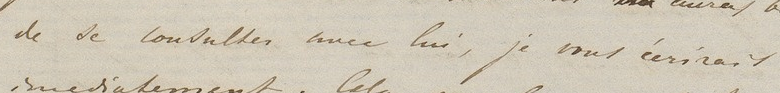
de se consulter avec lui, je vous écrirais
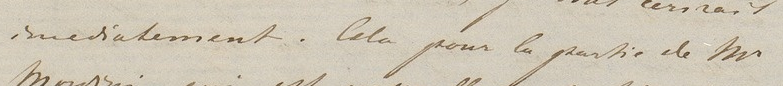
imediatement. Cela pour la partie de Mr
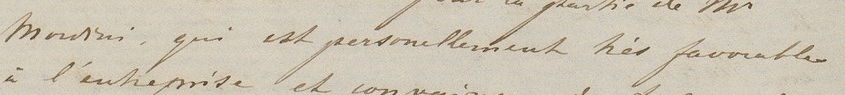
Mordini, qui est personellement très favorable
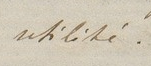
utilité.
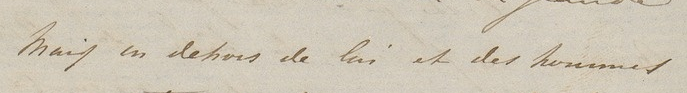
Mais en dehors de lui et des hommes
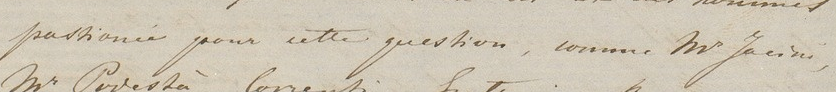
passionnés pour cette question, comme MrJacini,
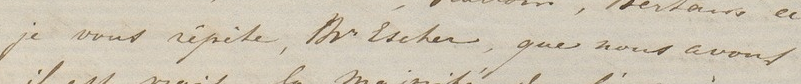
je vous répète, Mr Escher, que nous avons
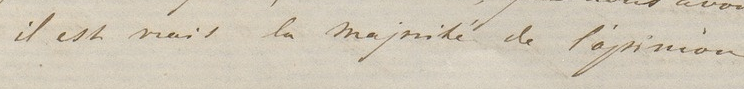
il est vrais la majorité de l'opinion
